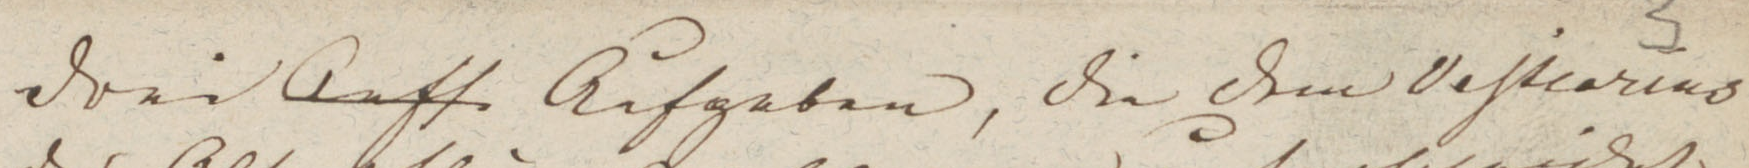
drei Aufl Aufgaben, die dem Vestiarius
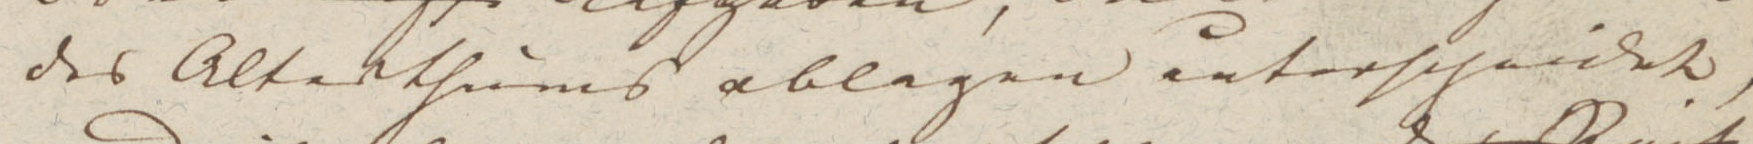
des Alterthums blagen unterscheidet,
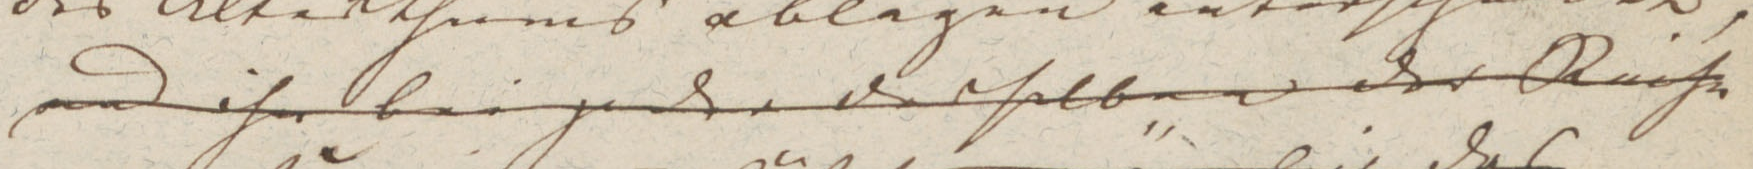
und ihn bei jeder derselben der Reihe
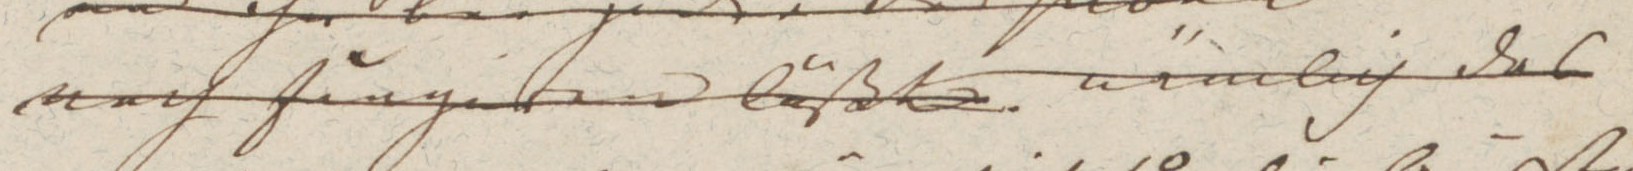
nach fungiren lässt nämlich das
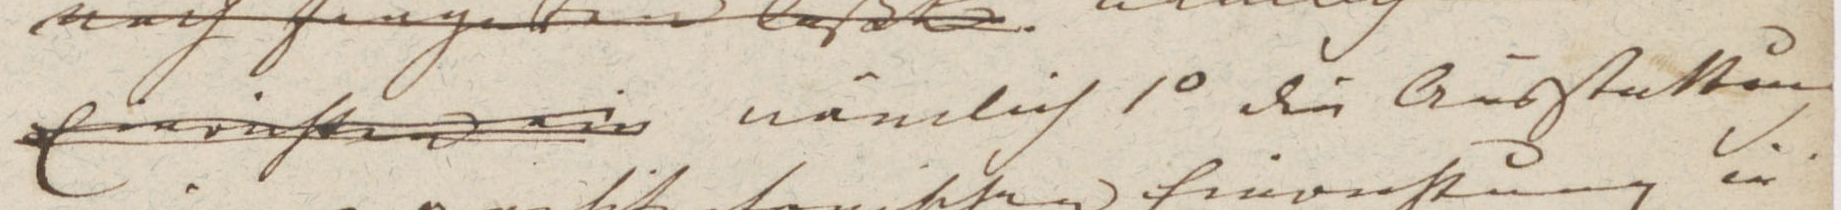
Einrichten ein nämlich 1° die Ausstattung
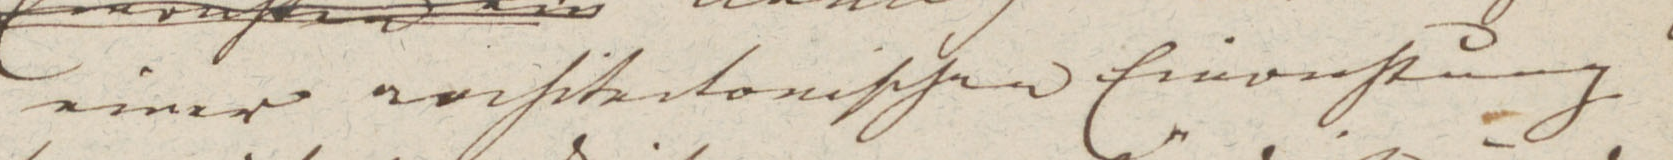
einer architectonischen Einrichtung in
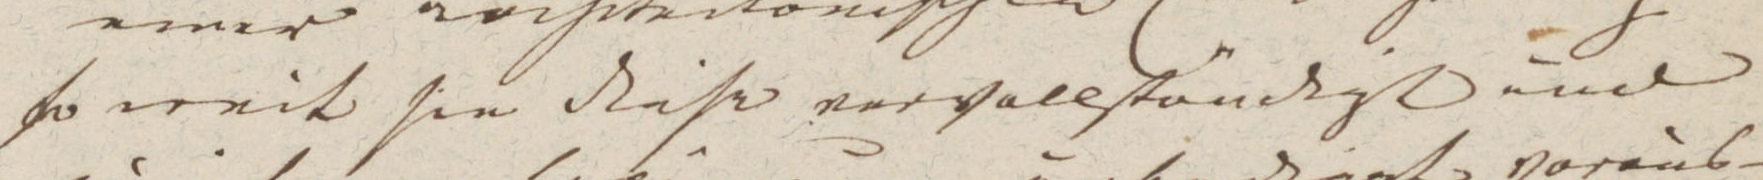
so weit sie diese vervollständigt und
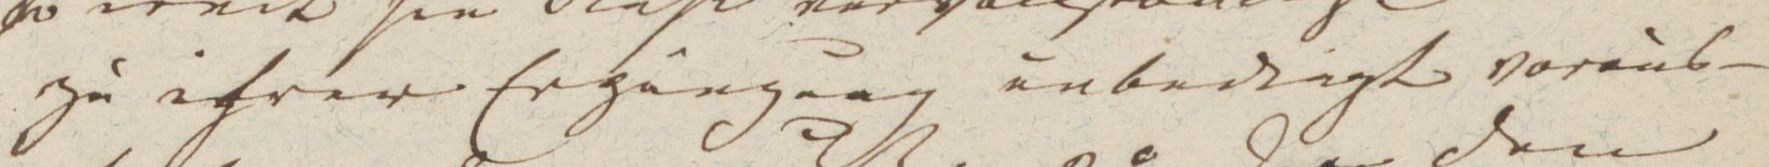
zu ihrer Ergänzung unbedingt voraus-
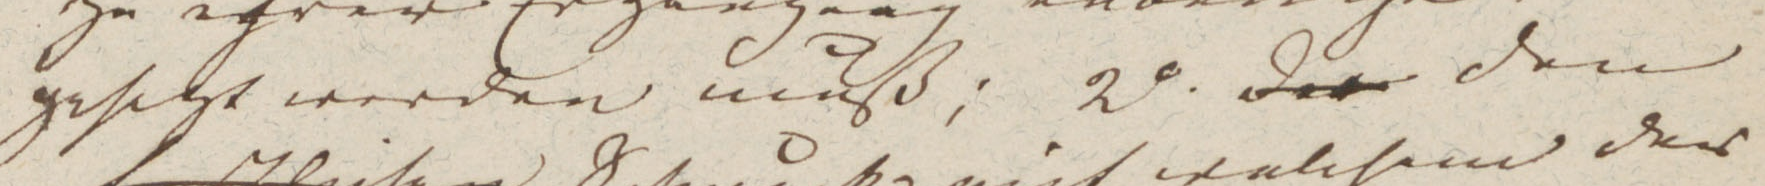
gesetzt werden muss; 2°. der den
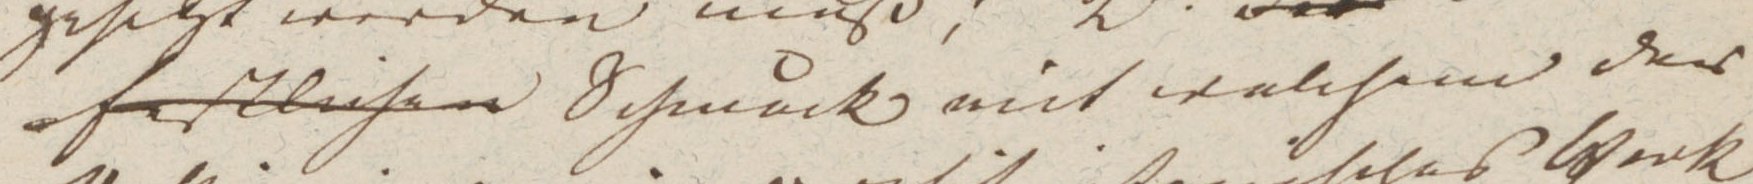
festlichen Schmuck mit welchem der
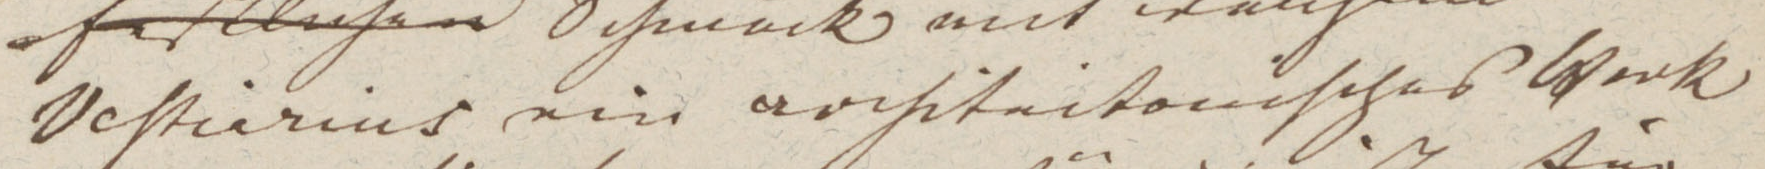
Vestiarius ein architectonisches Werk
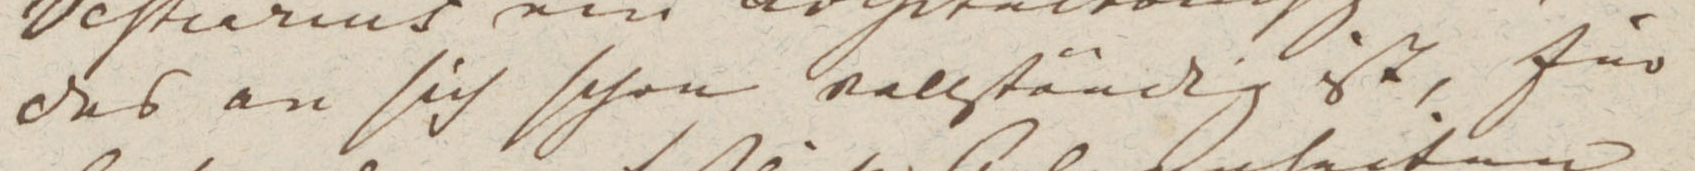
das an sich schon vollständig ist, für
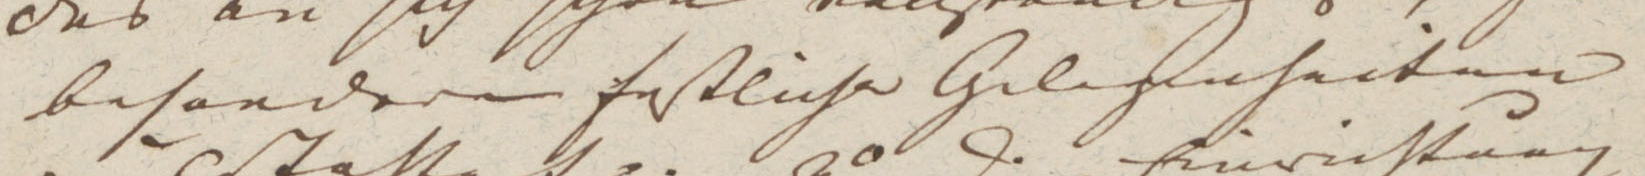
besondere festliche Gelegenheiten
